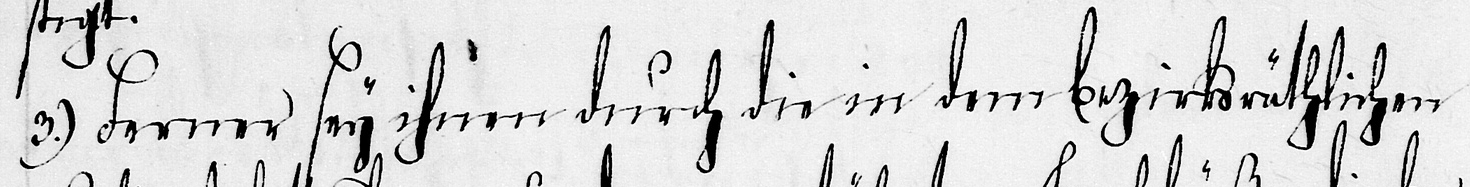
3.) Ferner sey ihnen durch die in dem bezirksräthlichen
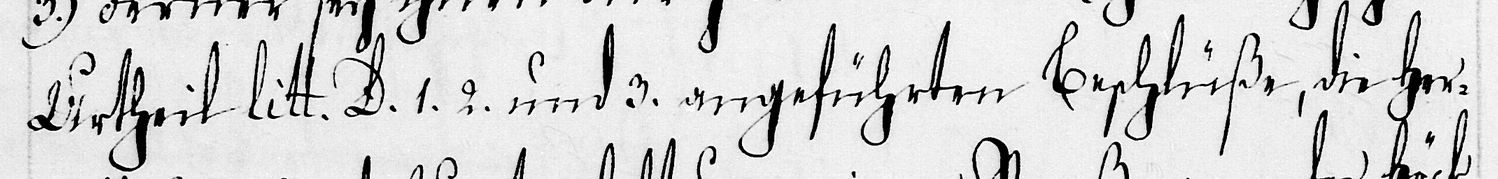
Urtheil litt. D. 1. 2. und 3. angeführten Beschlüße, die Her¬
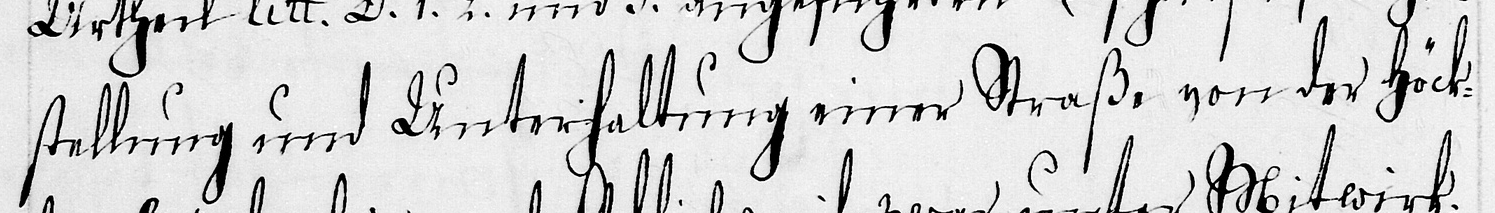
stellung und Unterhaltung einer Straße von der Höck¬
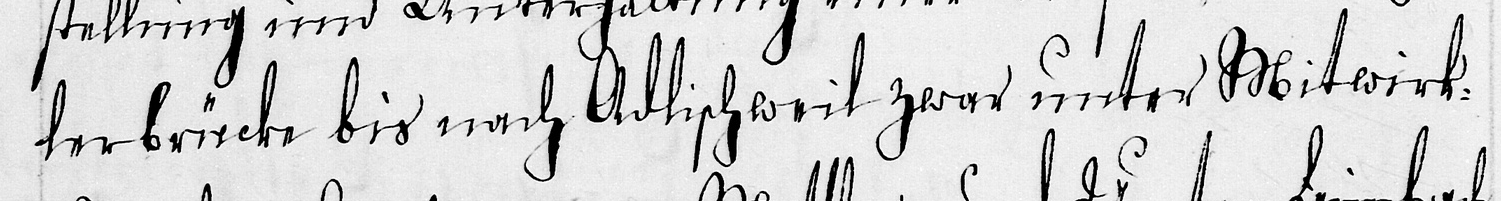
lerbrücke bis nach Adlischweil zwar unter Mitwirk¬
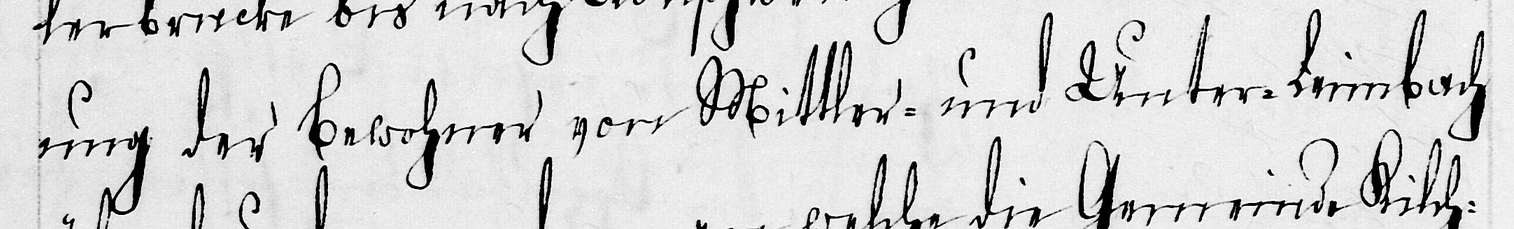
ung der Bewohner von Mittler- und Unter-Leimbach
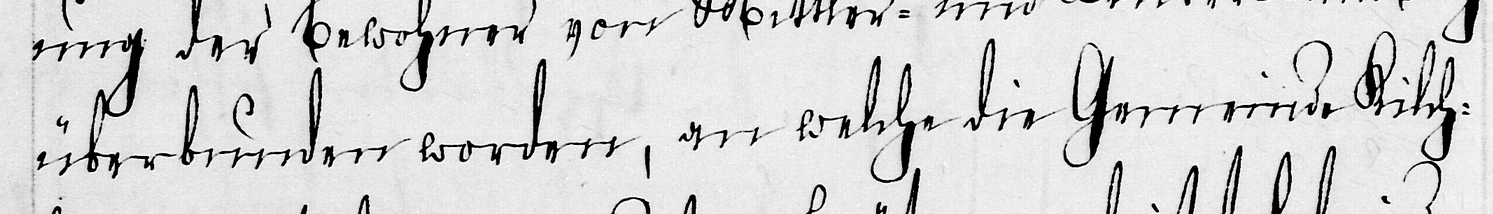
überbunden worden, an welche die Gemeinde Kilch¬
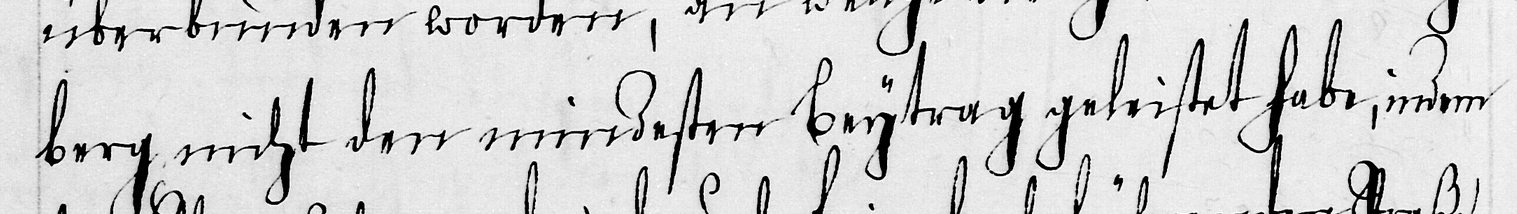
berg nicht den mindesten Beytrag geleistet habe, indem
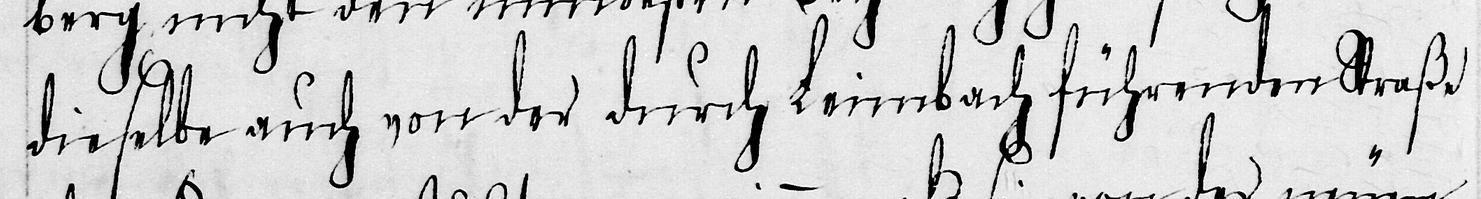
dieselbe auch von der durch Leimbach führenden Straße
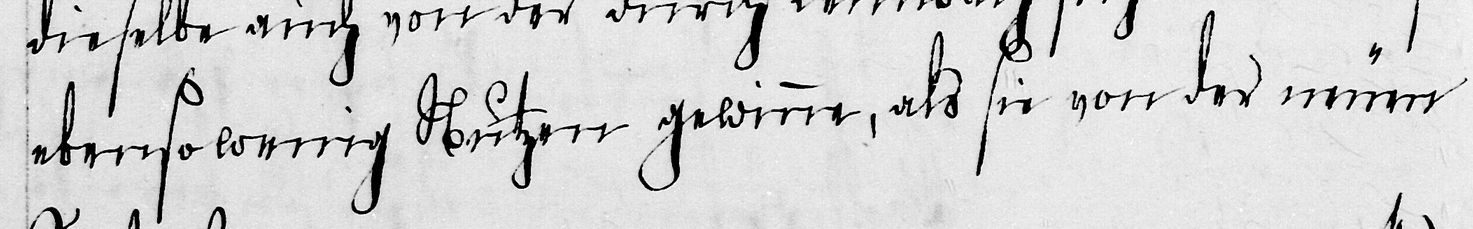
ebenso wenig Nutzen gewinne, als sie von der neuen
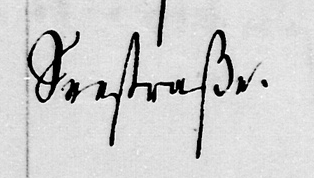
Seestraße.
